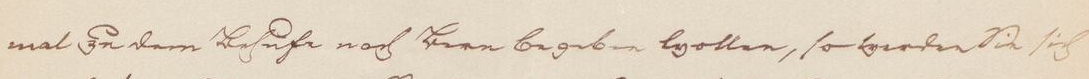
mal zu dem Behufe nach Bern begeben wollen, so werden Sie sich
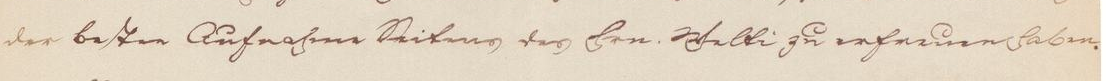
der besten Aufnahme Seitens des Hrn. Welti zu erfreuen haben.
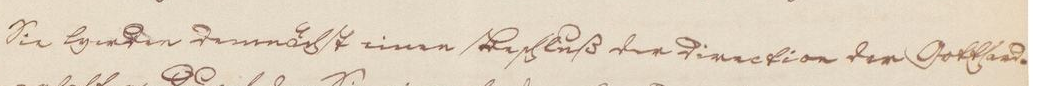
Sie werden demnächst einen Beschluß der Direction der Gotthard-
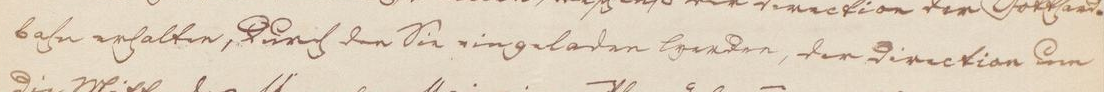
bahn erhalten, durch den Sie eingeladen werden, der Direction um
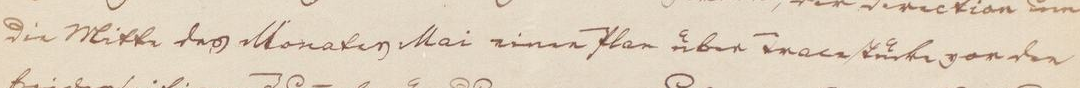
die Mitte des Monates Mai einen Plan über Tracestücke vor den
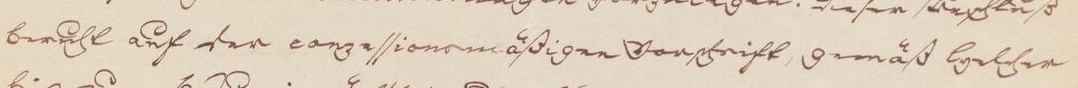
beruht auf der conzessionsmäßigen Vorschrift, gemäß welcher
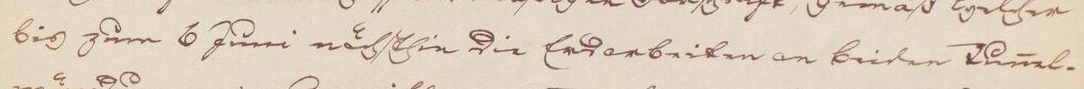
bis zum 6. Juni nächsthin die Erdarbeiten an beiden Tunnel-
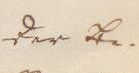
Der Be-
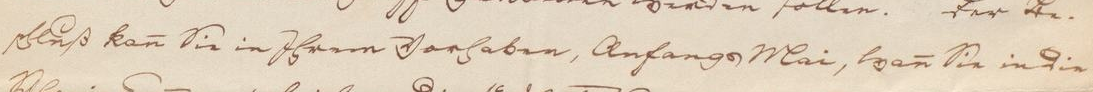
schluß kann Sie in Ihrem Vorhaben, Anfangs Mai, wenn Sie in die
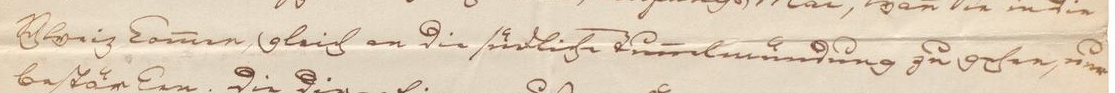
Schweiz kommen, gleich an die südliche Tunnelmündung zu gehen, nur
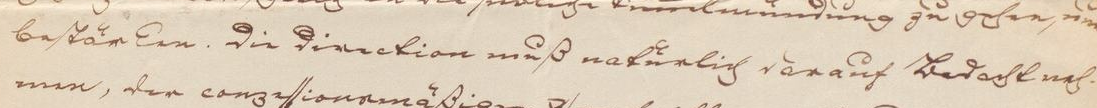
bestärken. Die Direction muß natürlich darauf Bedacht neh-
